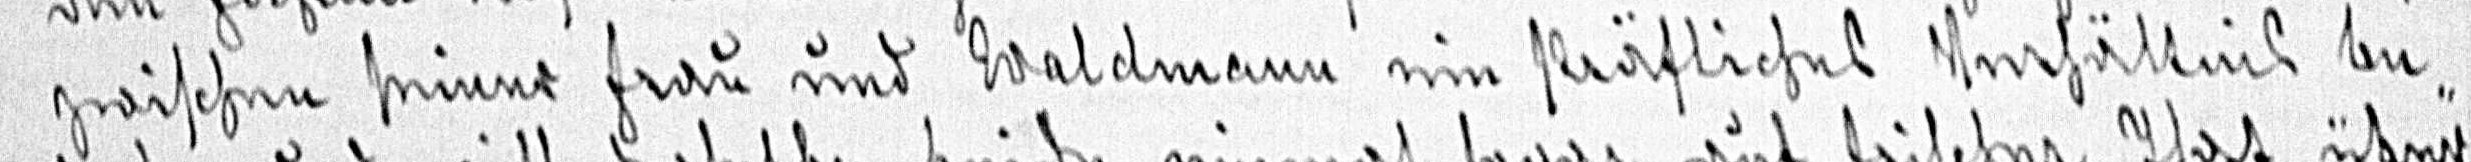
zwischen seiner Frau und Waldmann ein sträfliches Verhältnis be¬
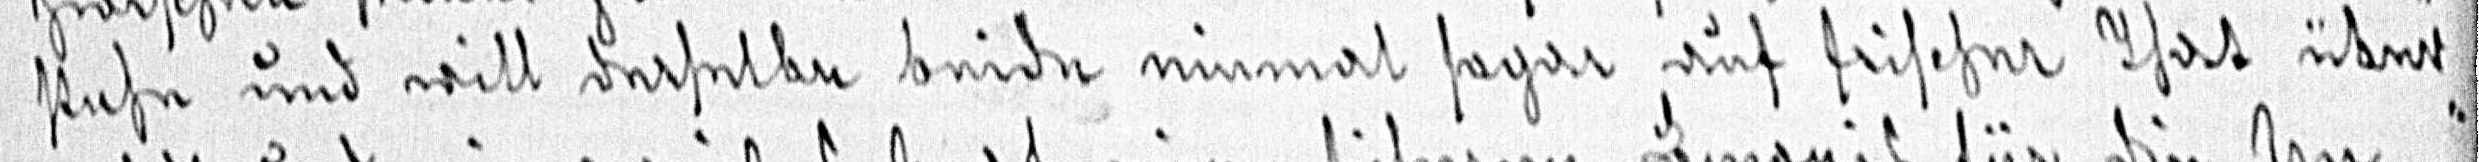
stehe und will derselbe beide einmal sogar auf frisches That über¬
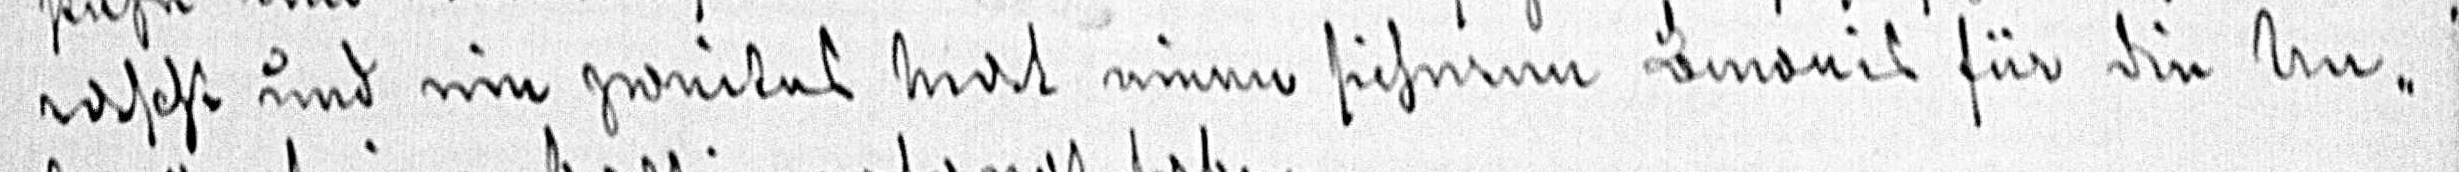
rascht und ein zweites Mal einen sicheren Beweis für die Un¬
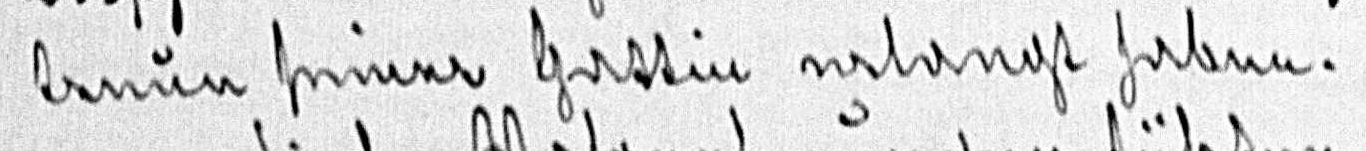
treue seiner Gattin erlangt haben.
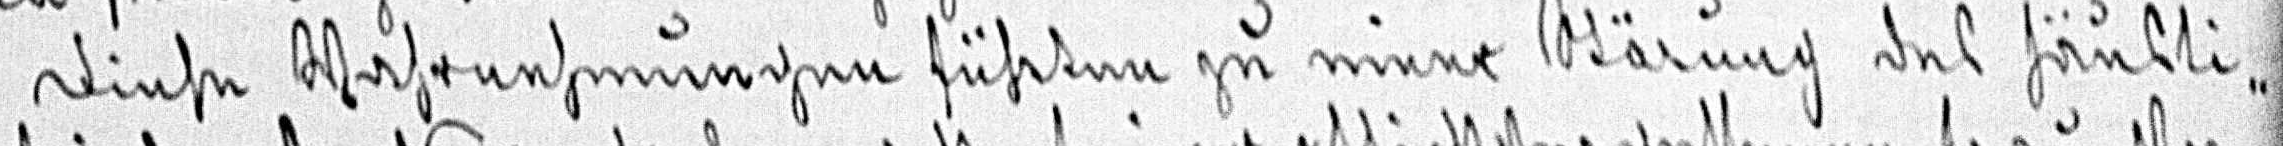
Diese Wahrnehmungen führten zu einer Stärkung des häusli¬
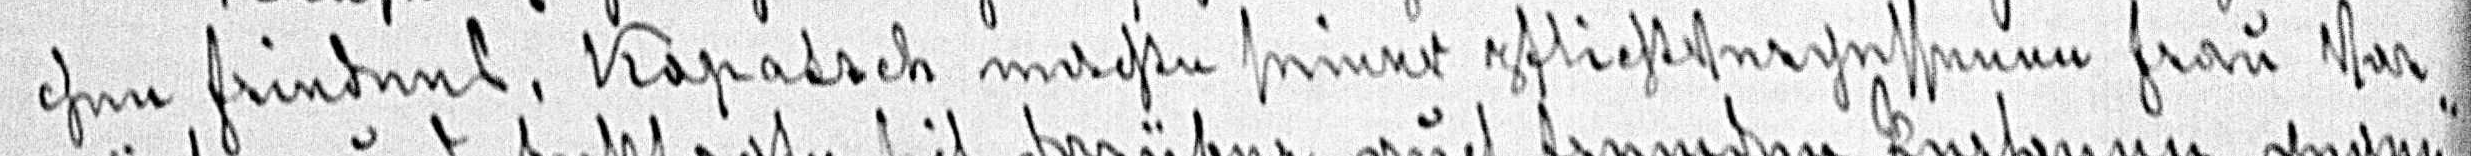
chen Friedens, Kopatsch machte seiner pflichtvergessene Frau Vor¬
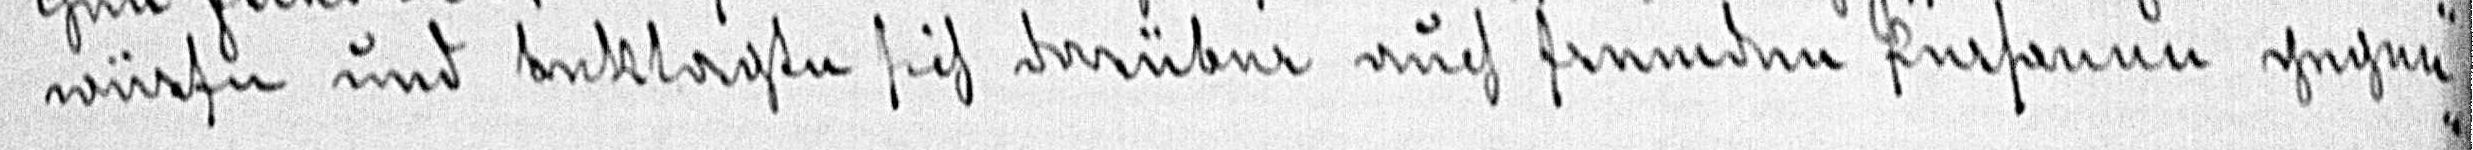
würfe und beklagte sich darüber auch fremden Personen gegen¬
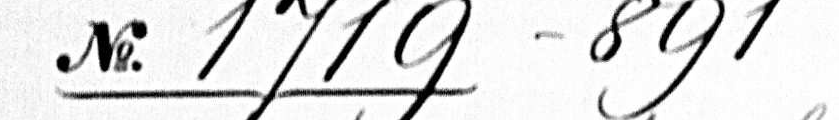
No 1719– 1891
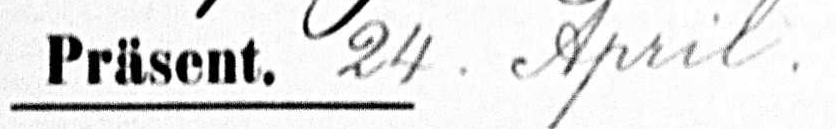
Präsent. – 24. April
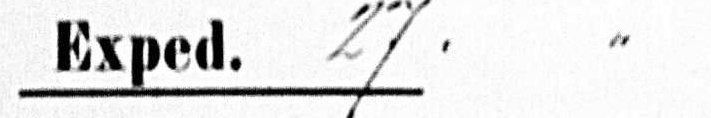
Exped. – 27. „
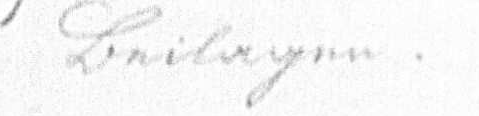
Beilagen
